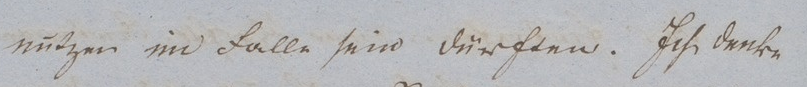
nutzen im Falle sein dürften. Ich denke
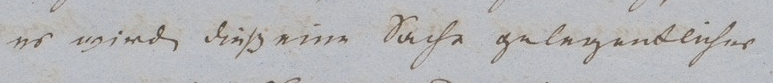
es wird dieß eine Sache gelegentlicher
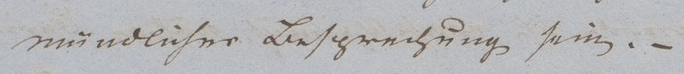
mündlicher Besprechung sein. –
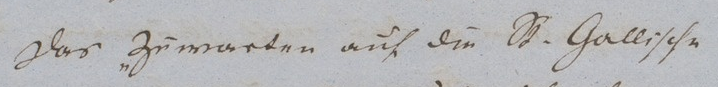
Das «Zuwarten» auf die St. Gallische
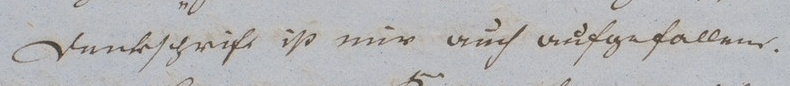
Denkschrift ist mir auch aufgefallen.
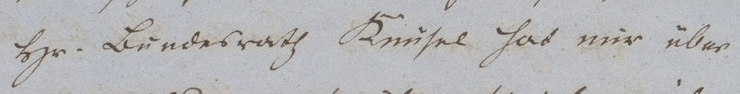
Hr. Bundesrath Knüsel hat mir über
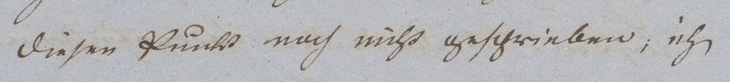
diesen Punkt noch nicht geschrieben; ich
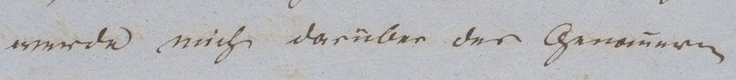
werde mich darüber des Genauern
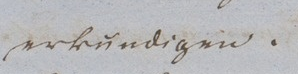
erkundigen.
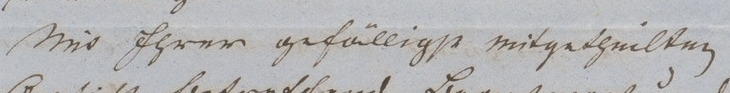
Mit Ihrer gefälligst mitgetheilten
